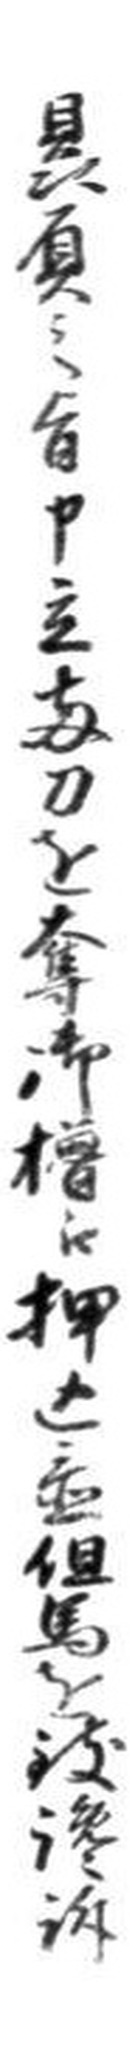贔屓之旨申立両刀を奪御櫓江押込置但馬を致讒訴
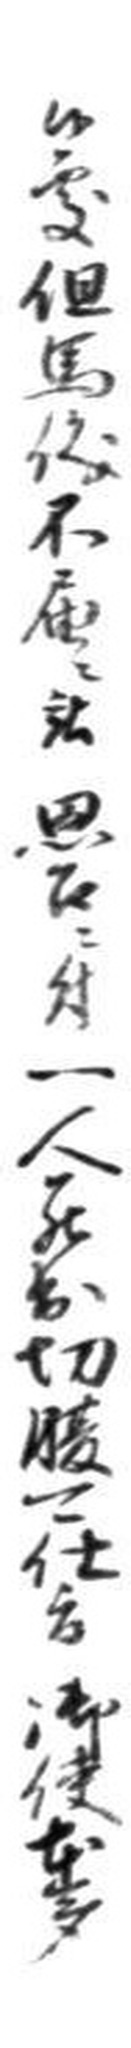候処但馬儀不届ニ被思召ニ付一人罷出切腹可仕旨御使本多
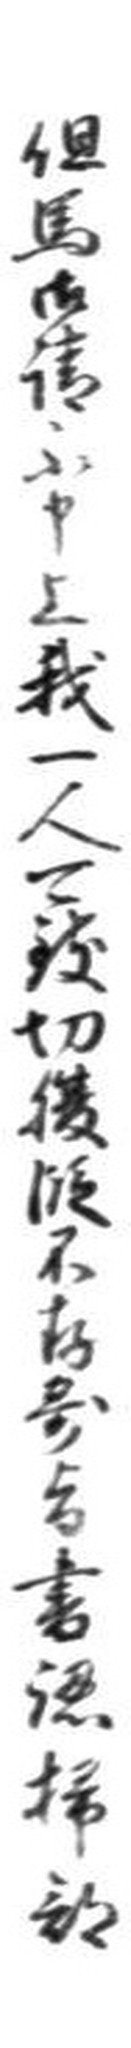但馬御請不申上我一人可致切腹段不存寄旨書認掃部
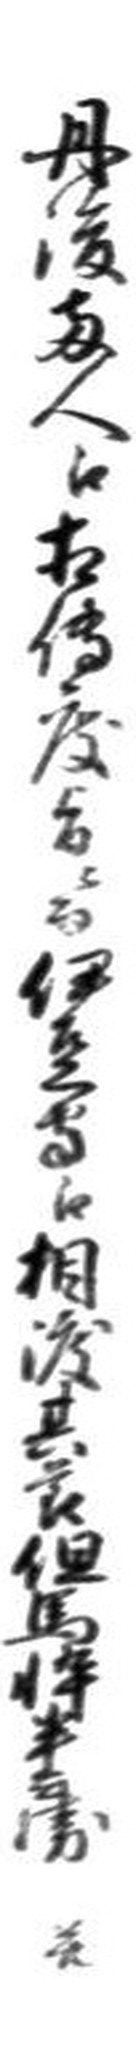丹後両人江相伝度旨ニ而伊豆守江相渡其節但馬忰半兵衛并
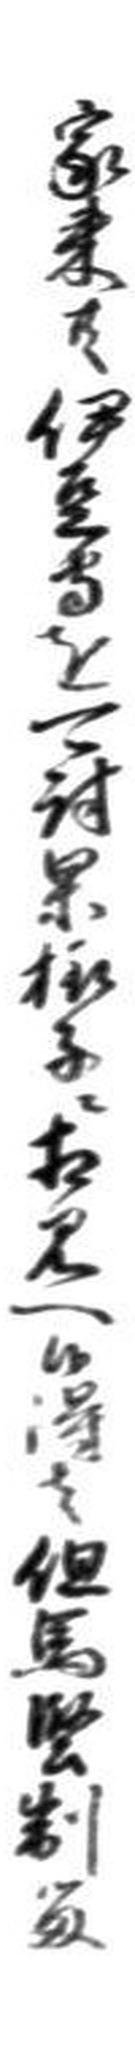家来共伊豆守を可討果様子ニ相見へ候得者但馬堅制留
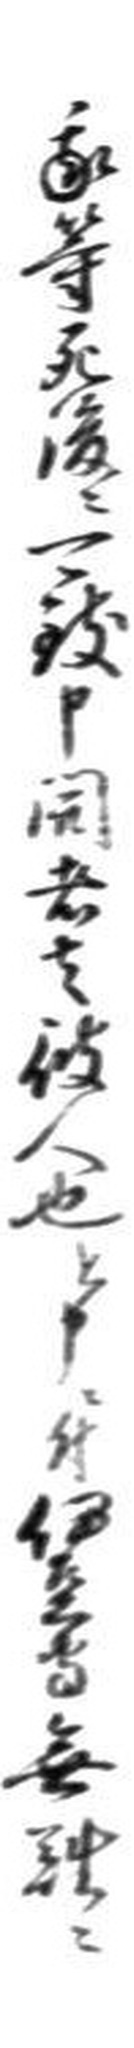我等死後ニ可致申開者者彼人也と申ニ付伊豆守無難ニ
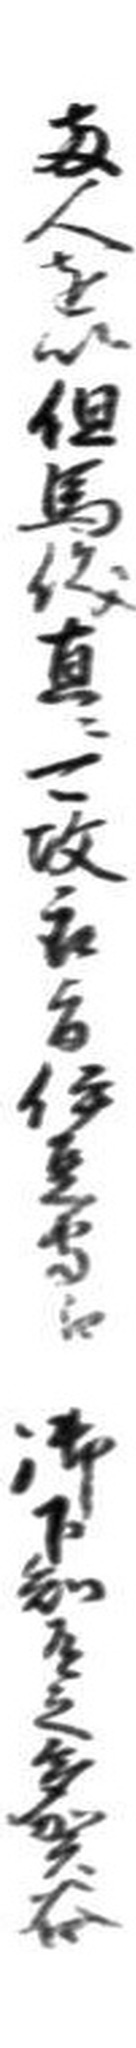両人を以但馬儀直ニ可攻取旨伊豆守江御下知有之多賀谷
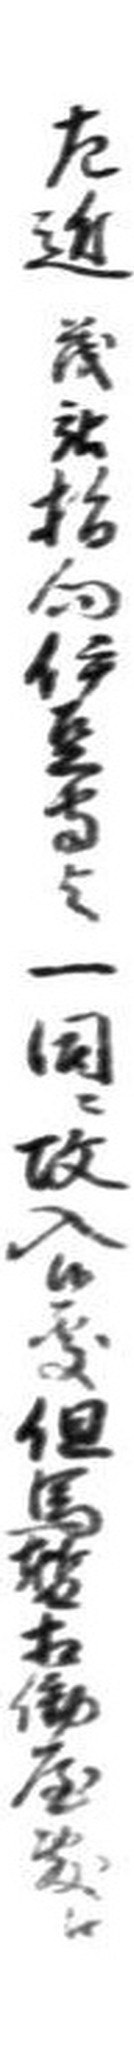左近茂被指向伊豆守与一同ニ攻入候処但馬暫相働屋敷江
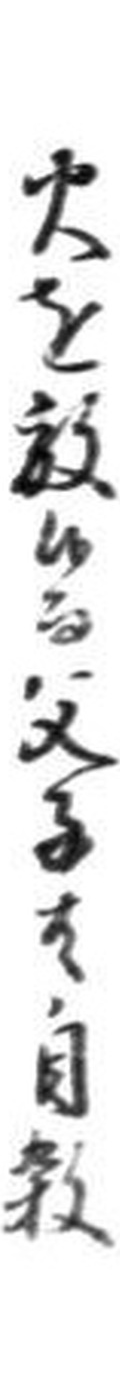火を放候而父子共自殺

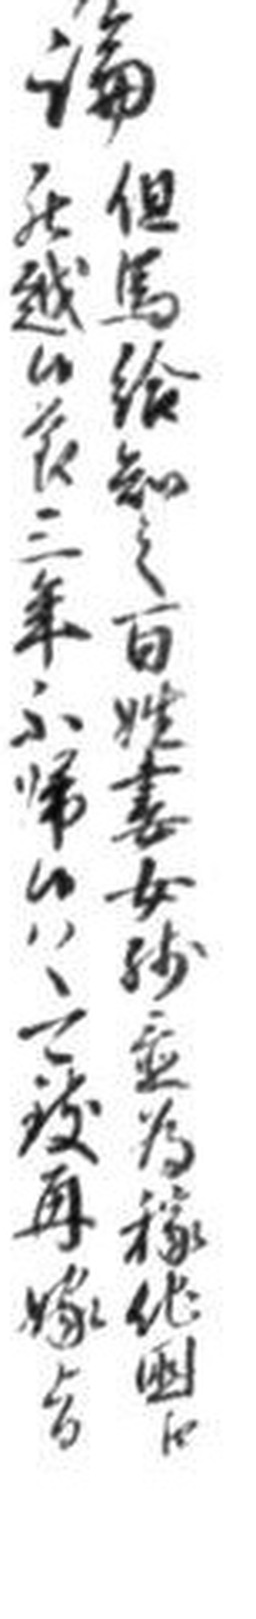罷越候節三年不帰候ハヽ可致再嫁旨
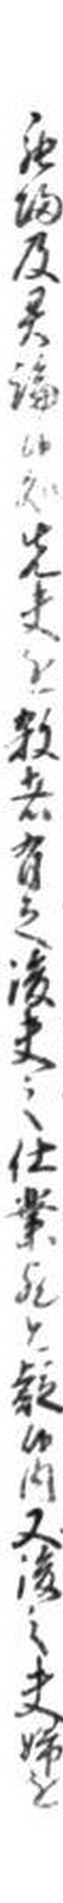罷帰及異論候処先夫を殺者有之後夫之仕業歟と疑候内又後之夫姉を
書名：家譜 二 忠直公 従文禄四年到慶安四年
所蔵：福井県文書館 Fukui Prefectural Archives
